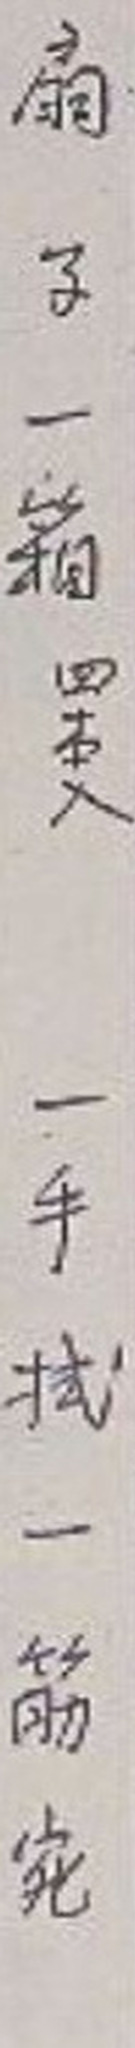一扇子一箱四本入一手拭一筋宛
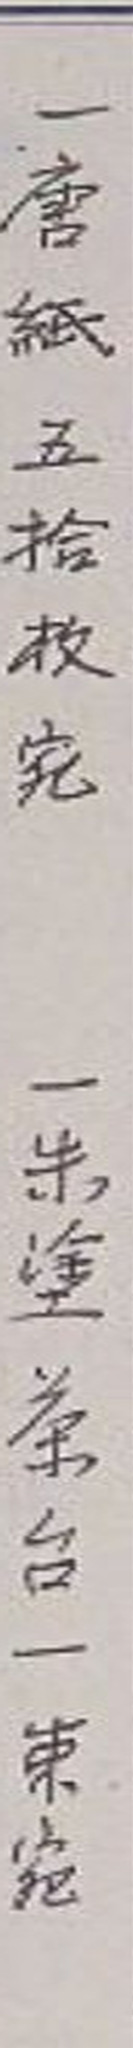一唐紙五拾枚宛一朱塗茶台一束宛
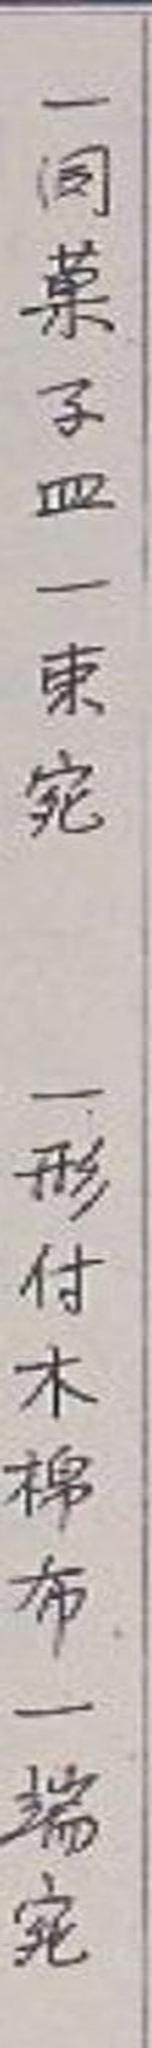一同菓子皿一束宛一形付木棉布一端宛

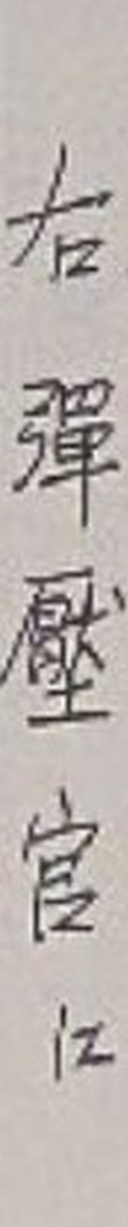右弾正官え
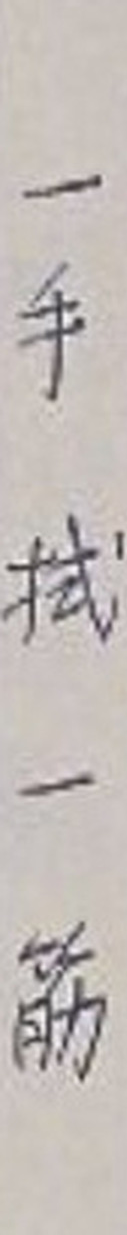一扇子一箱一手拭一筋
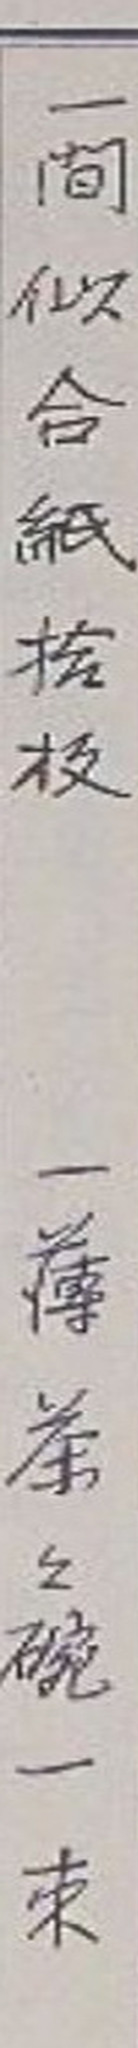一間似合紙拾枚一薄茶々碗一束
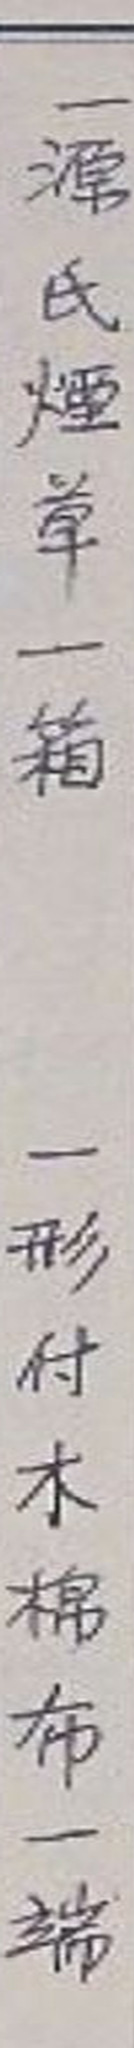一源氏煙草一箱一形付木棉布一端
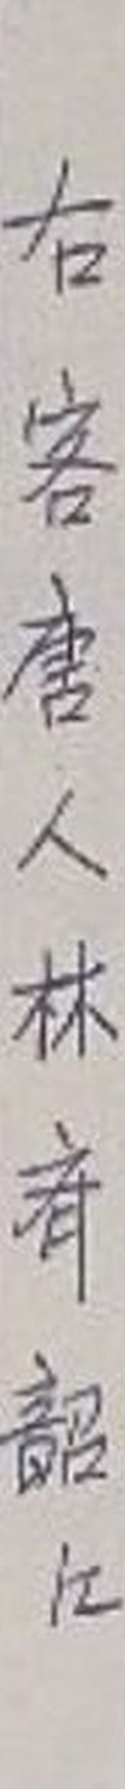右客唐人林斉韶え
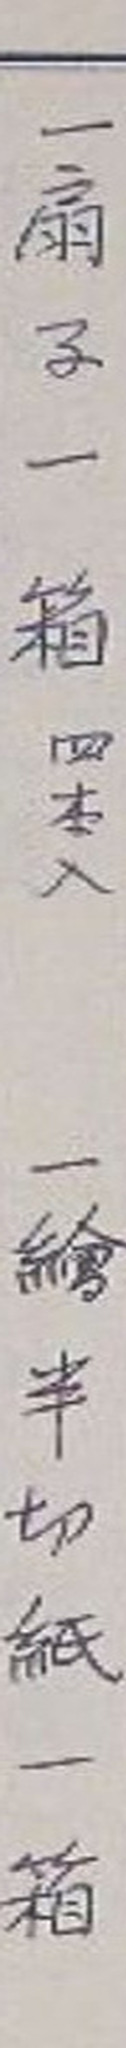一扇子一箱四本入一絵半切紙一箱
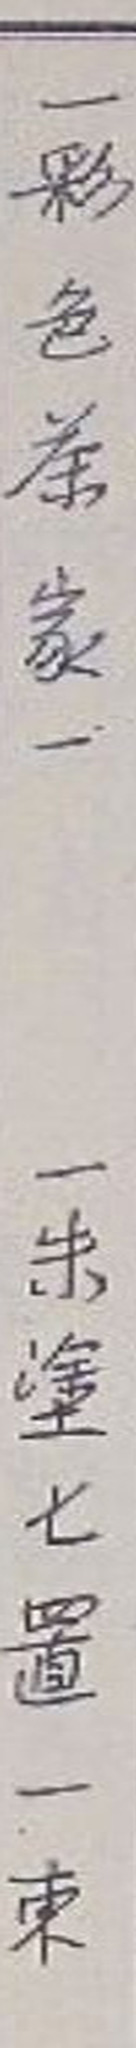一彩色茶家一一朱塗匕置一束
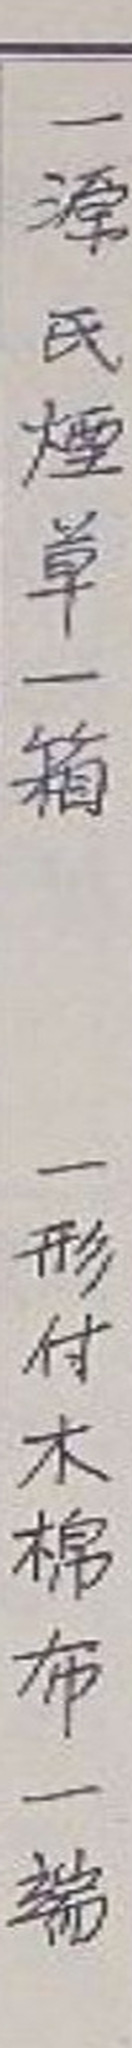一源氏煙草一箱一形付木棉布一端
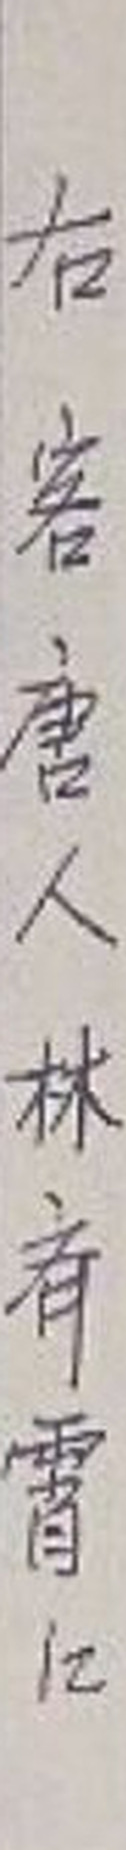右客唐人林斉霄え
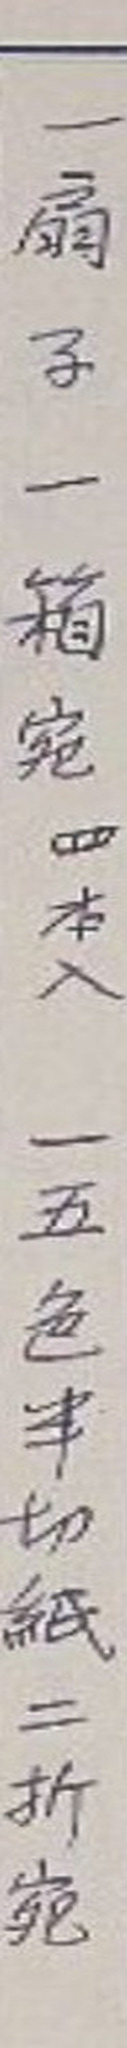一扇子一箱宛四本入一五色半切紙二折宛
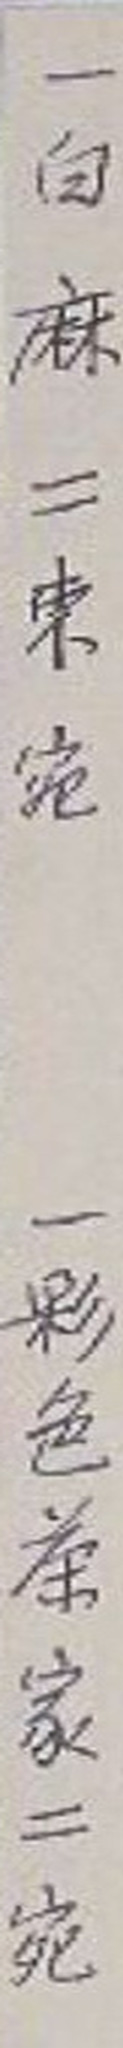一白麻二束宛一彩色茶家二宛
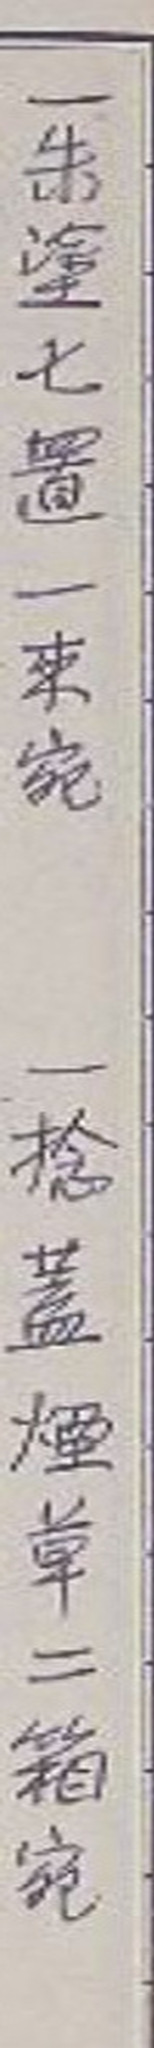一朱塗匕置一束宛一捻蓋煙草二箱宛
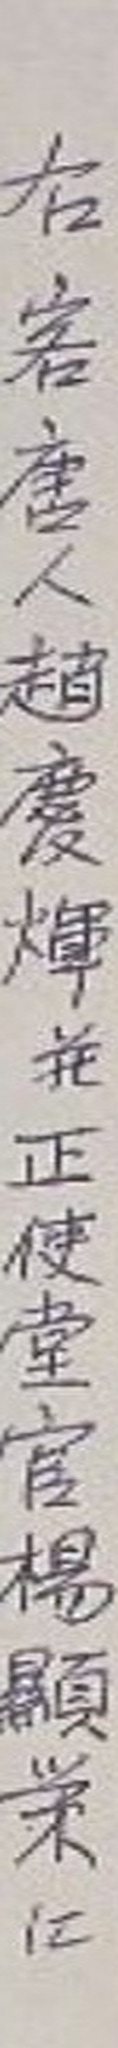右客唐人趙慶煇并正使堂官楊顕栄え
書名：支那冊封使来琉諸記 下巻
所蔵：University of the Ryukyus Library
